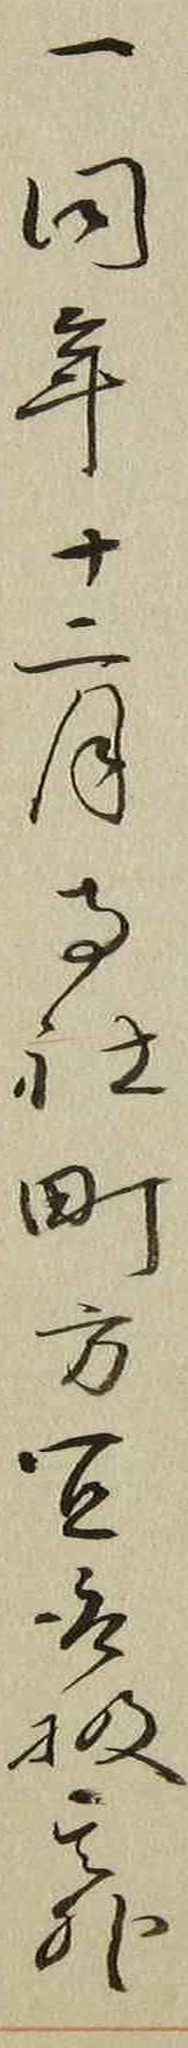一同年十二月寺社町方宜取扱其外
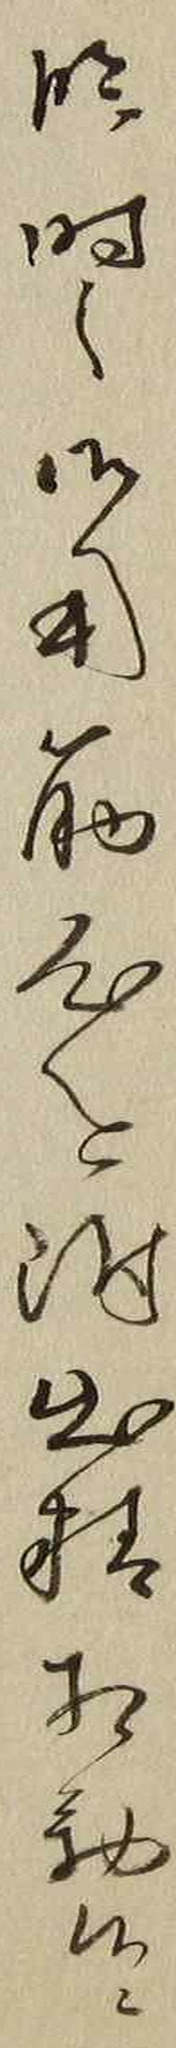臨時之御用筋心を附出精相勤候に
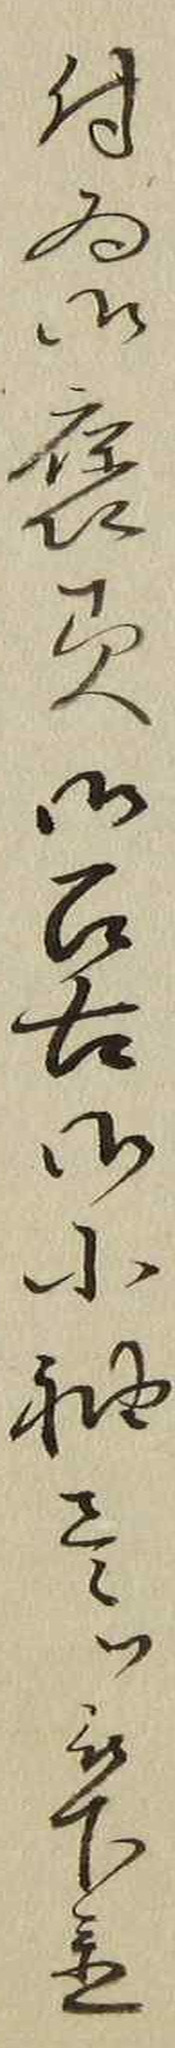付為御褒美御召古小袖壱つ被下置
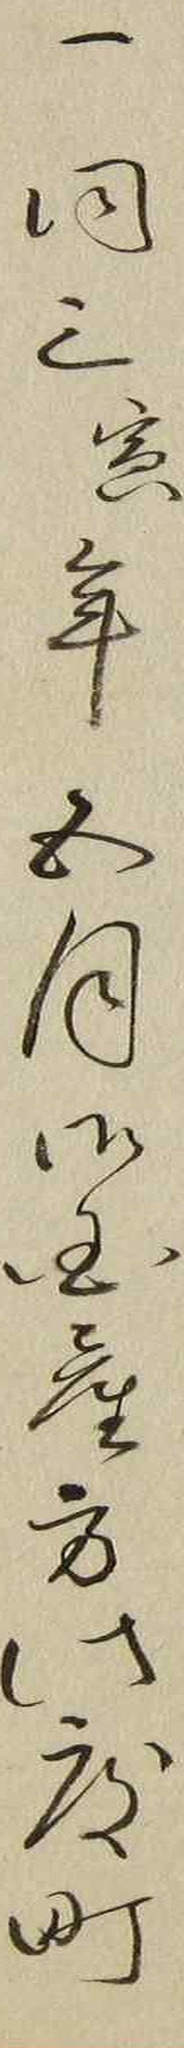一同三寅年五月御国産方此度町
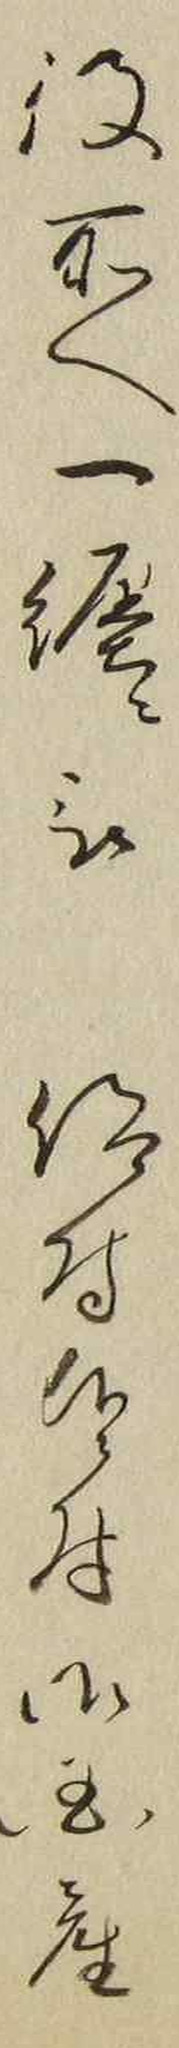役所へ一纏に被仰付候に付御国産
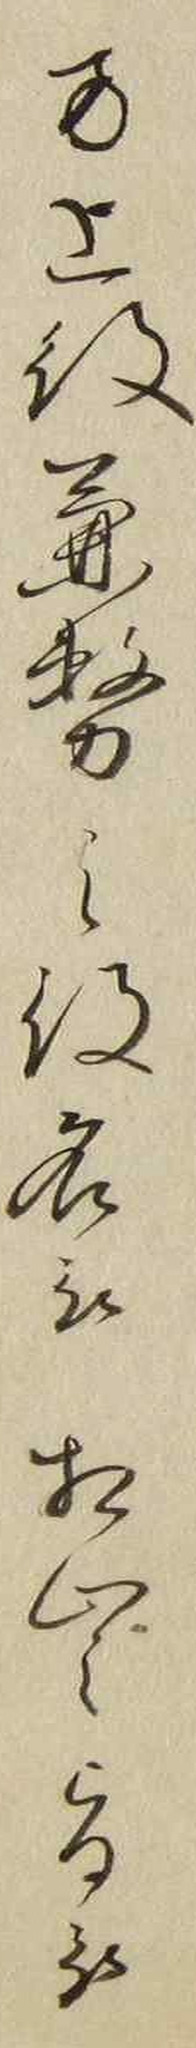方上役兼務之役名被相止之旨被

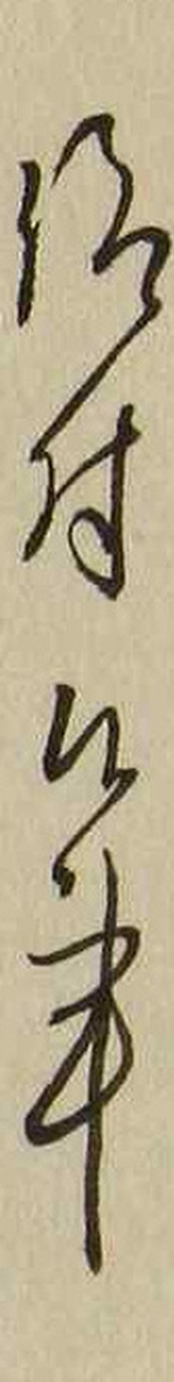仰付候事
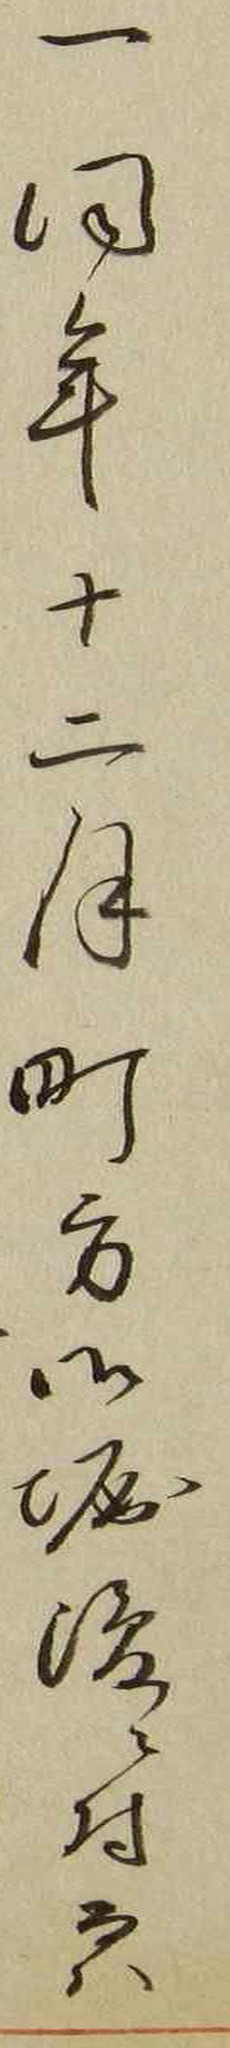一同年十二月町方御堀浚に付而ハ
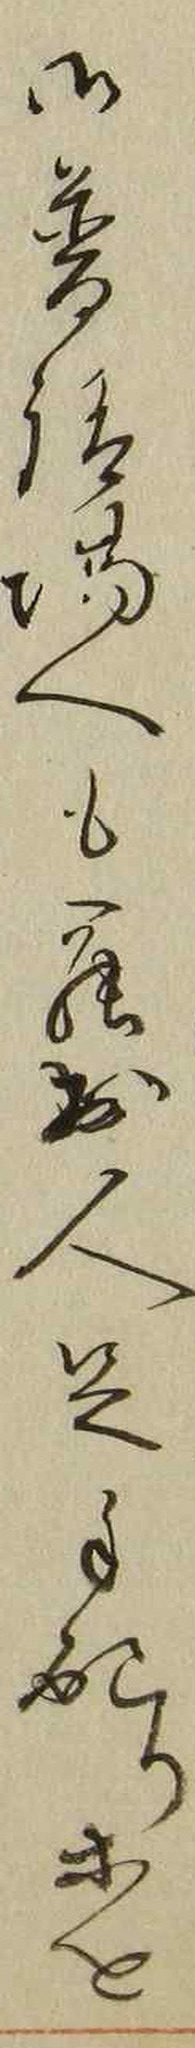御普請番へも罷出人足手配り等を
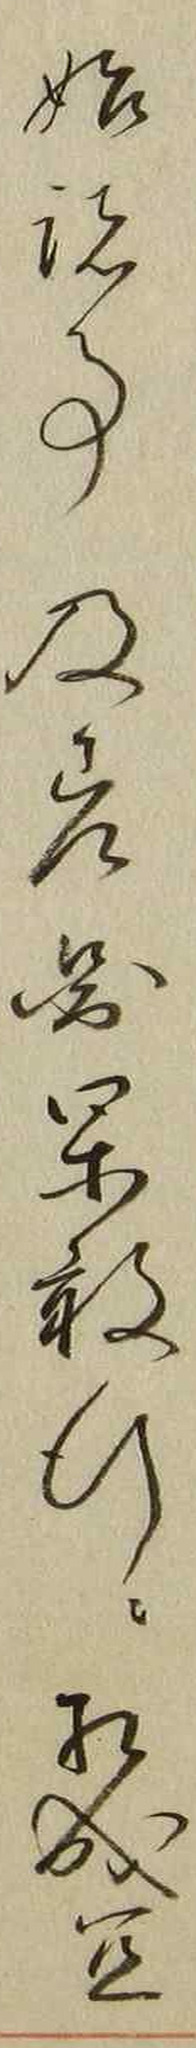始諸事及差図果敢行に相成宜
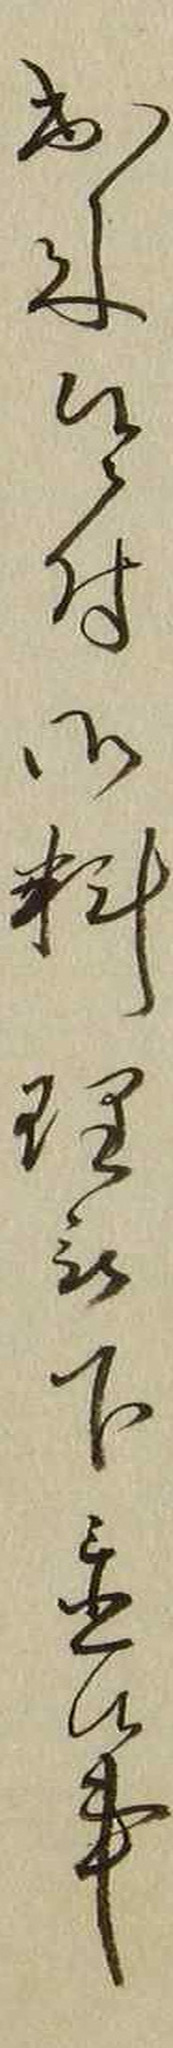出来候付御料理被下置候事
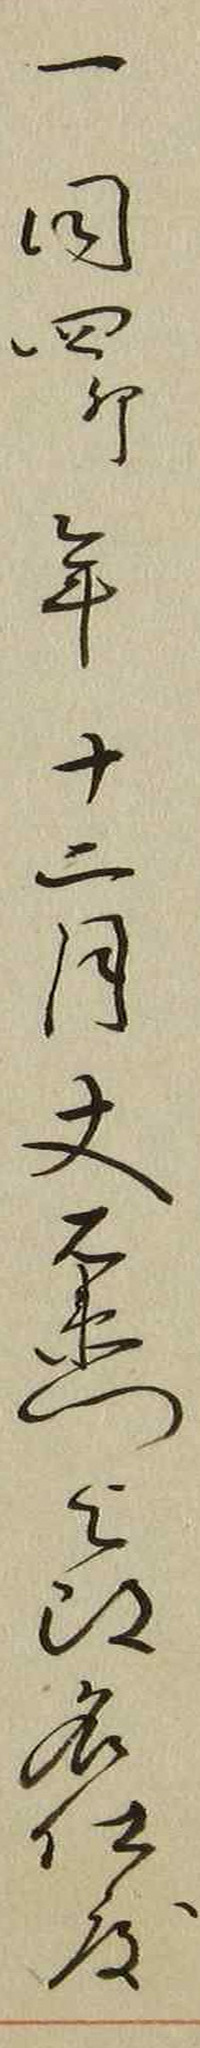一同四卯年十二月丈右衛門と改名仕度
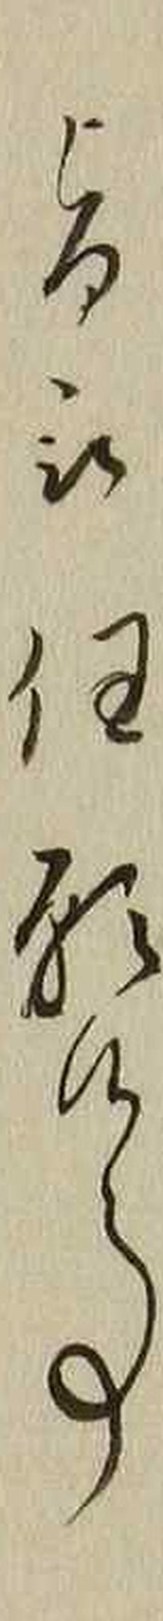旨被任願候事
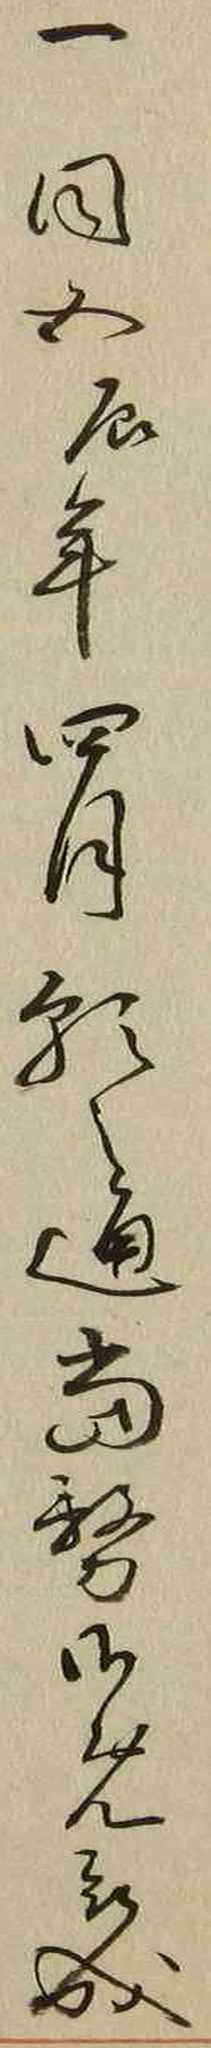一同五辰年四月願之通当務御免被成
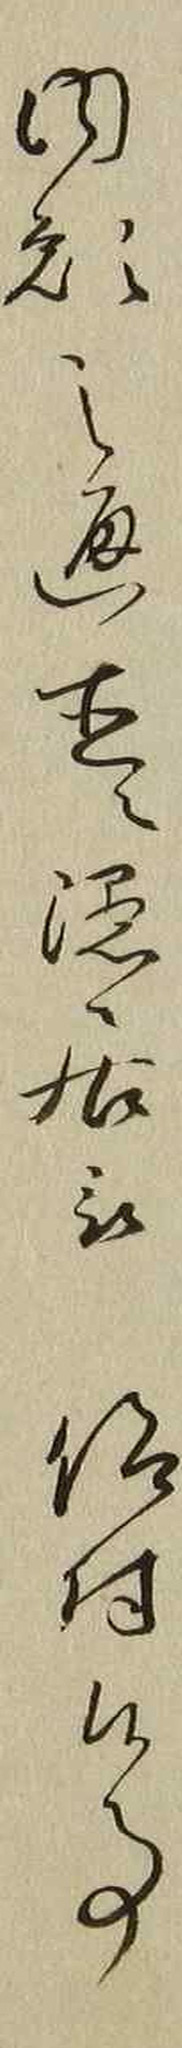内頑之通直に隠居被仰付候事
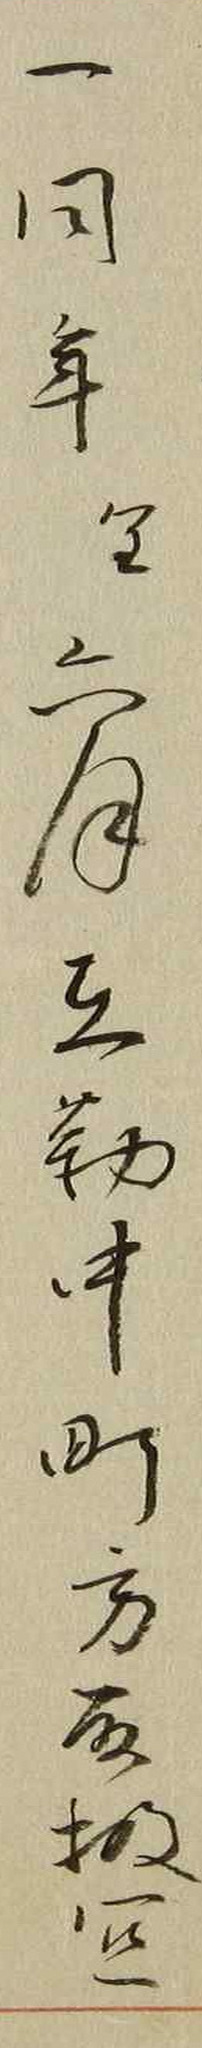一同年閏六月在勤中町方取扱宜
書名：諸士系譜　巻之3　い之部3
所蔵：会津若松市立会津図書館
